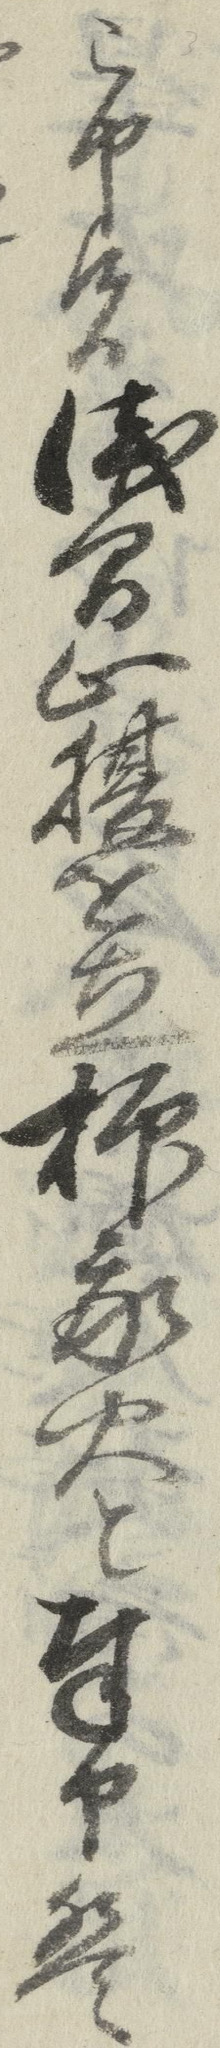被申候而浅間山榎を有抑我火と奉申は
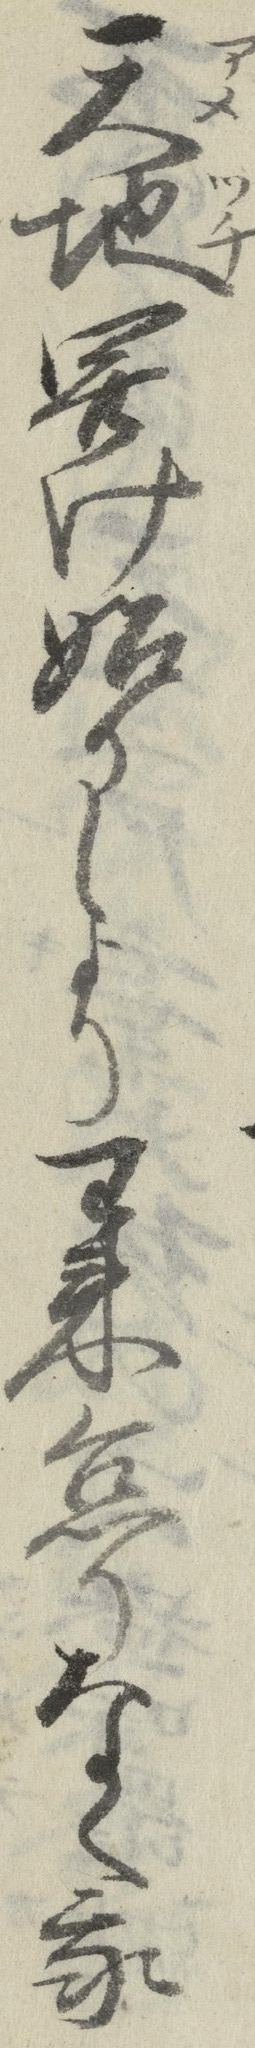天地開け始りしより已来怠りなく我

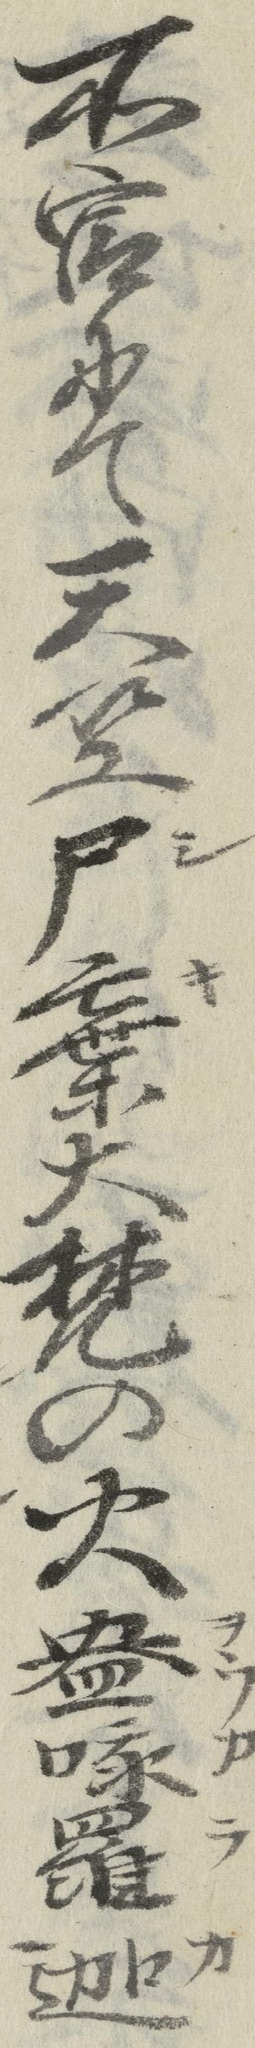所官にて天竺尸棄大焚の火盎啄羅迦
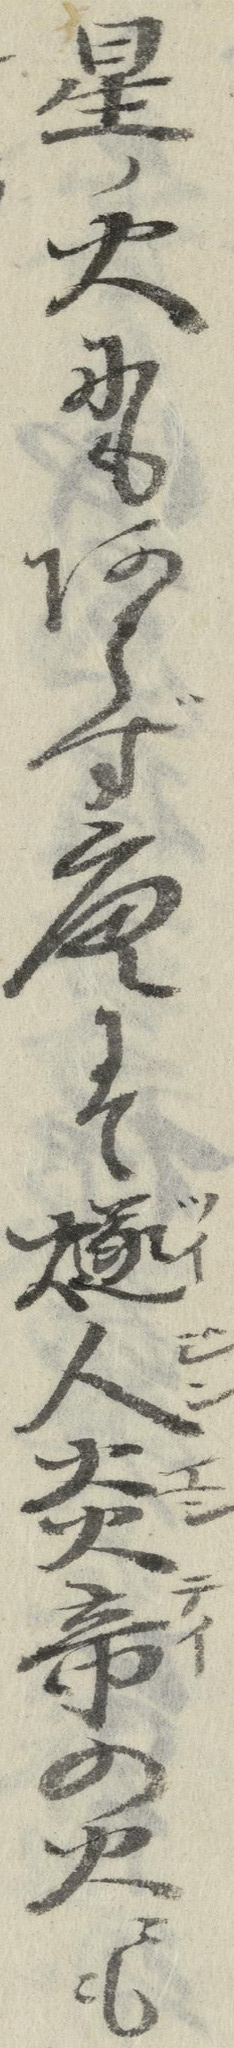星ノ火にもあらず庵にて燧人炎帝の火にも
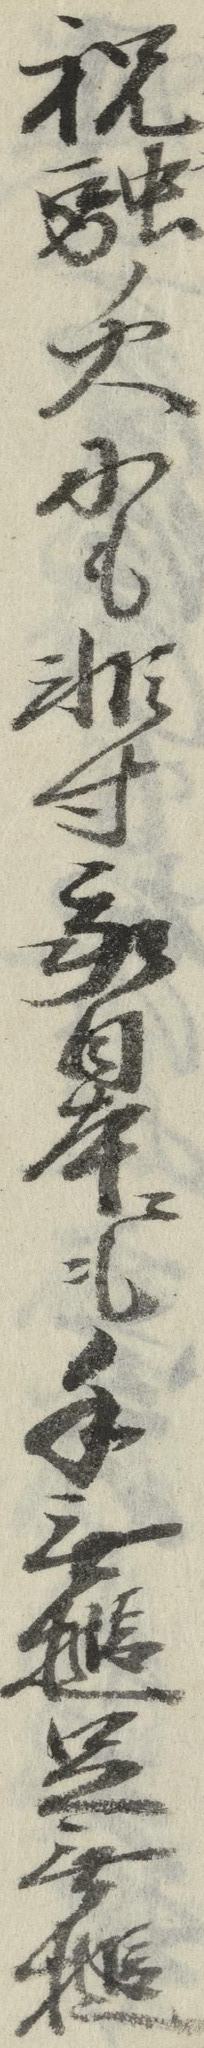祝融ノ火にも非す我日本にも手無搥足無搥
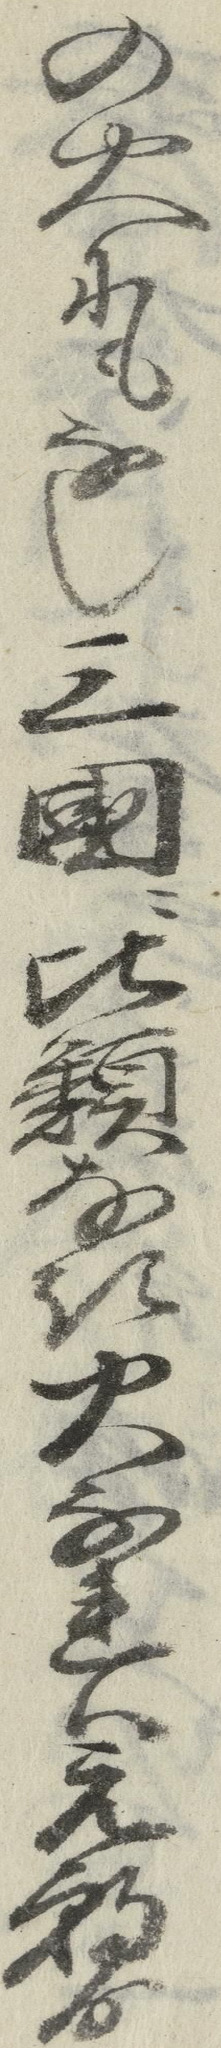の火にもなし三国に比類なき火なれ共元朝ゟ
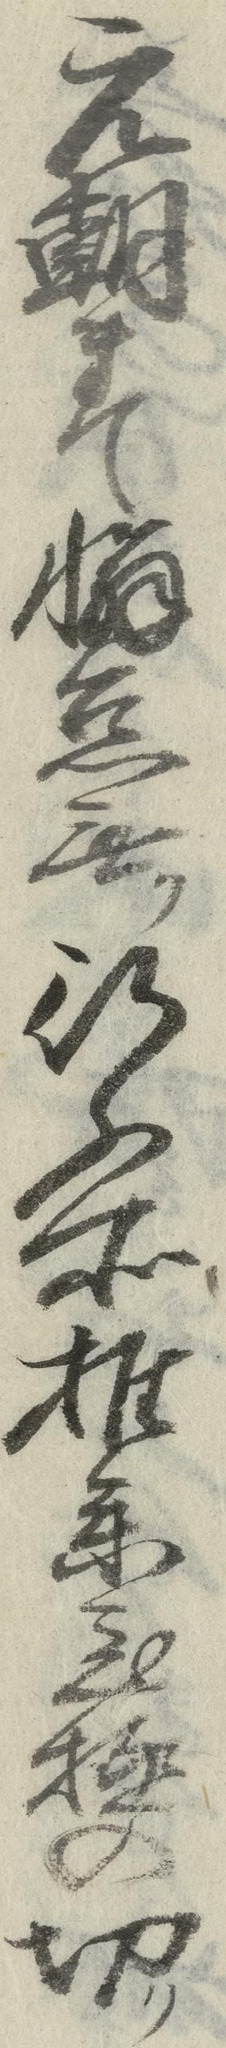元朝まて懈怠無行ふ所推参至極の切
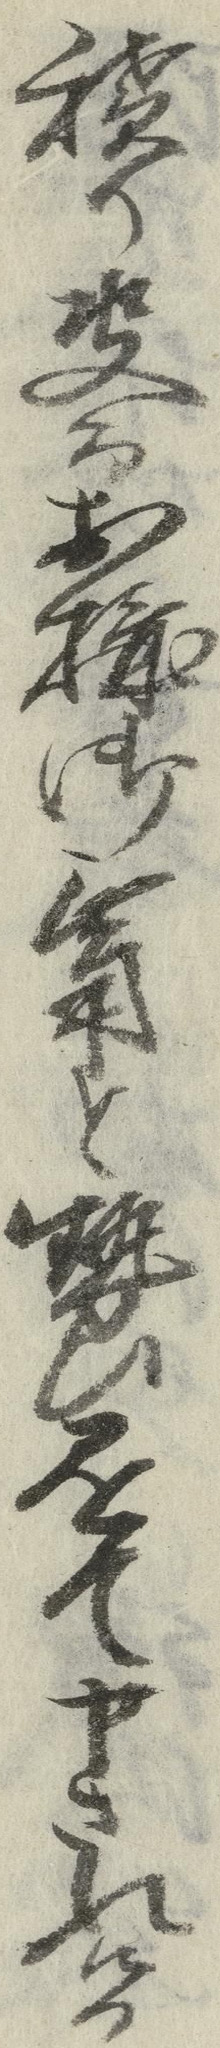積り決而お構御無用と勢ひ懸て申されける
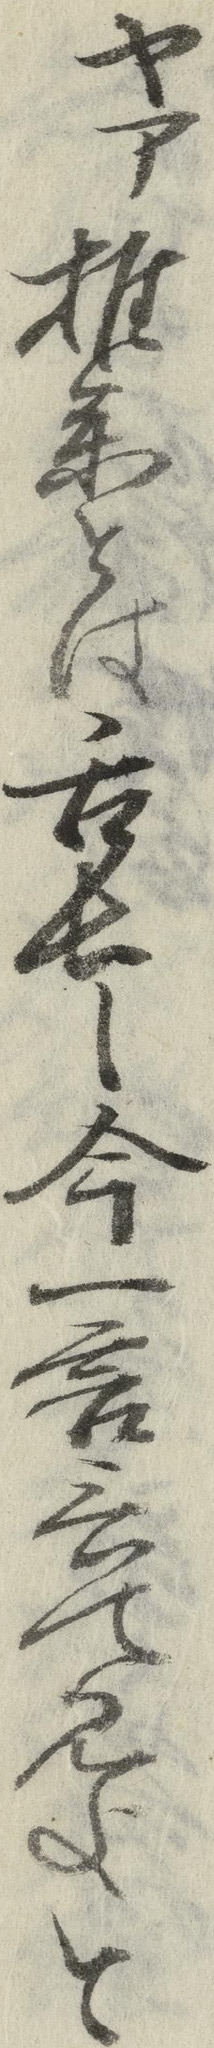ヤア推参とは舌長し今一言云て見よと
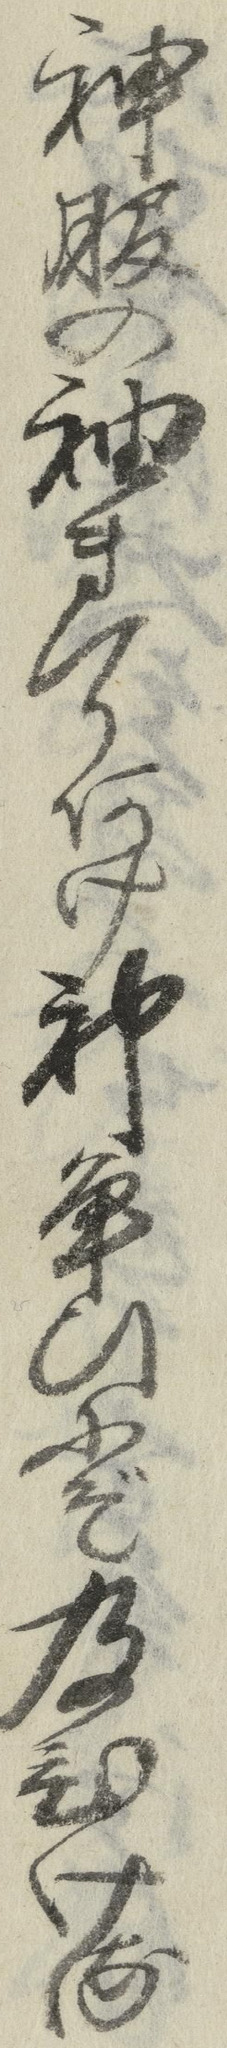神服の袖まくりあけ神争ひにぞ及ひける
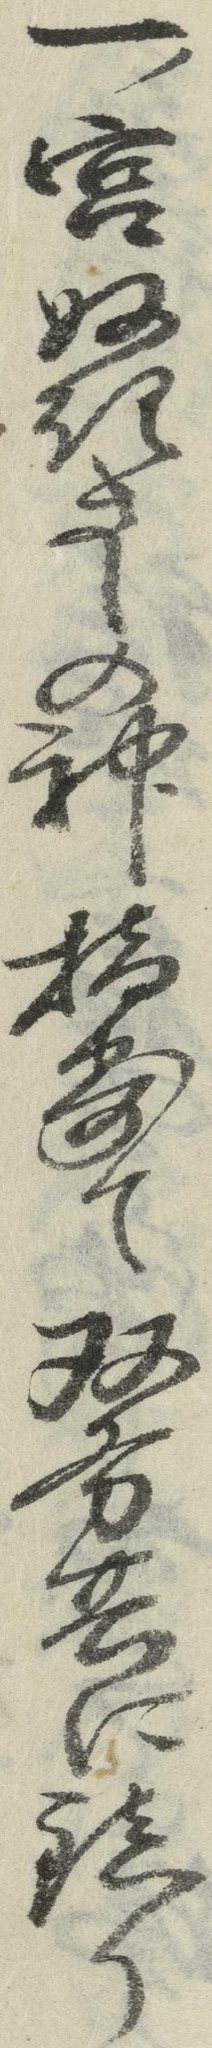一ノ宮ぬきさしの神指寄て双方共に鎮り
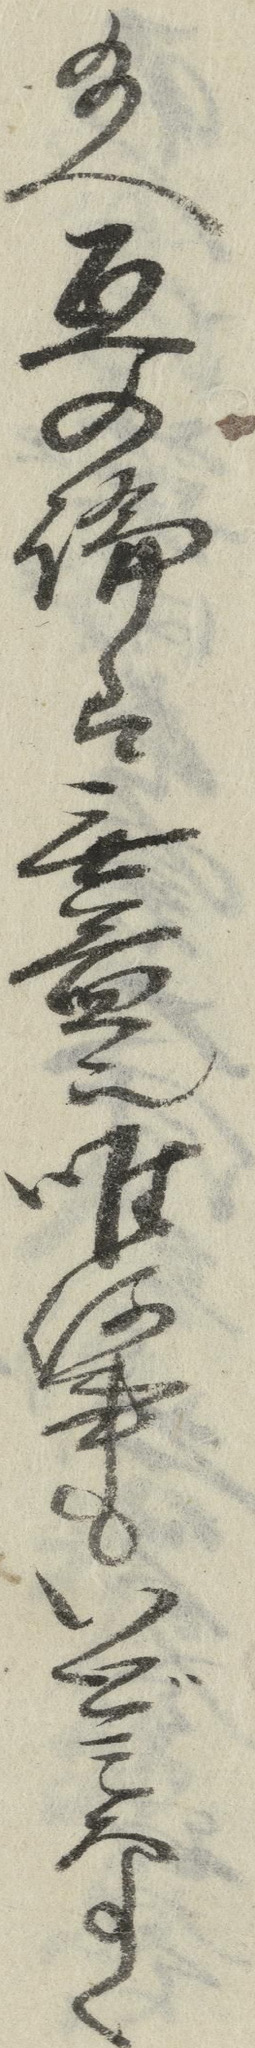給へ互の論は無益也唯何事もいどみなく
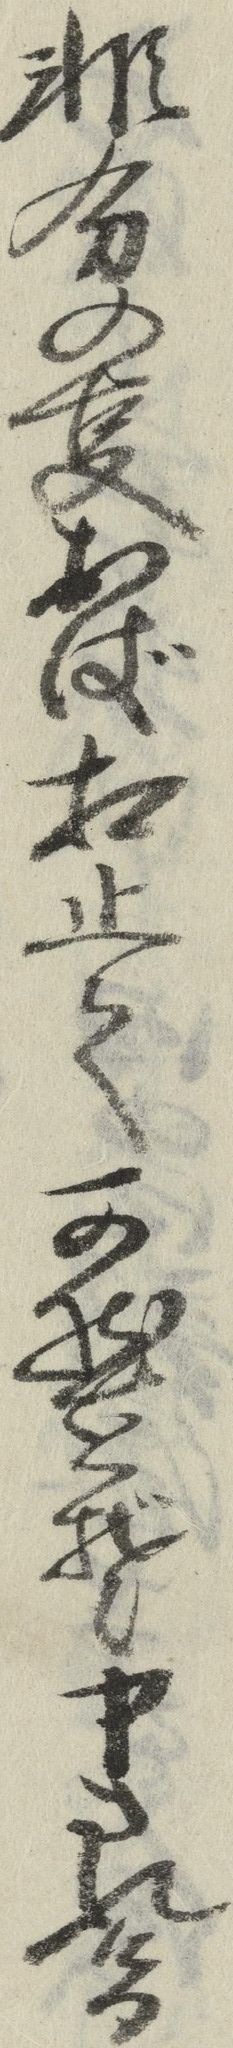非分の事おば相止て可然とぞ申されける
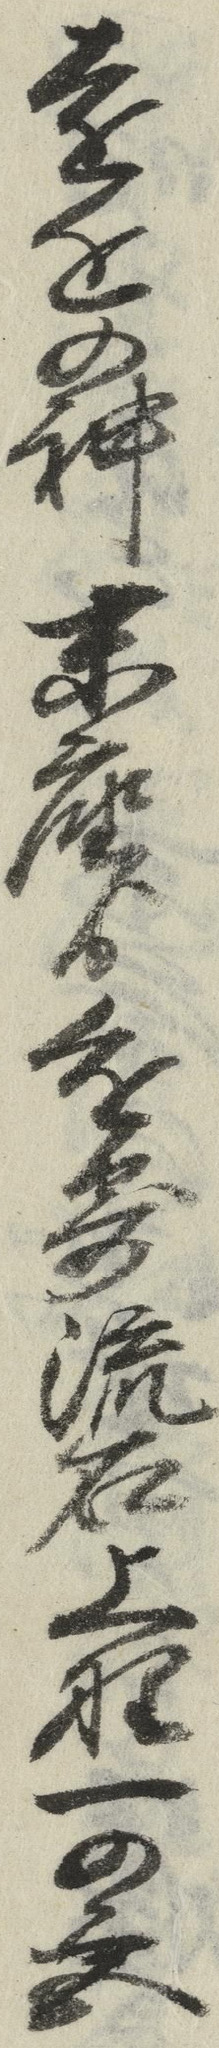遠近の神末座ゟ遠寄流石上野一の宮
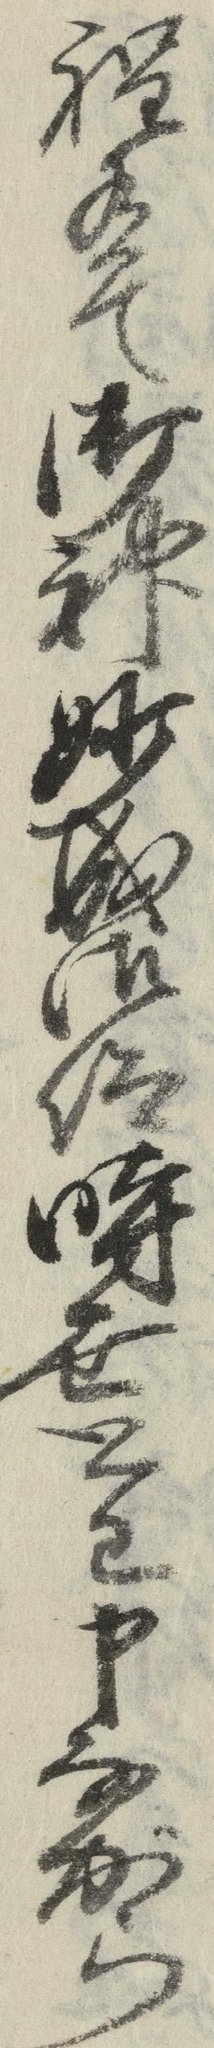程有て御神妙成御仰時世とわ申ながら
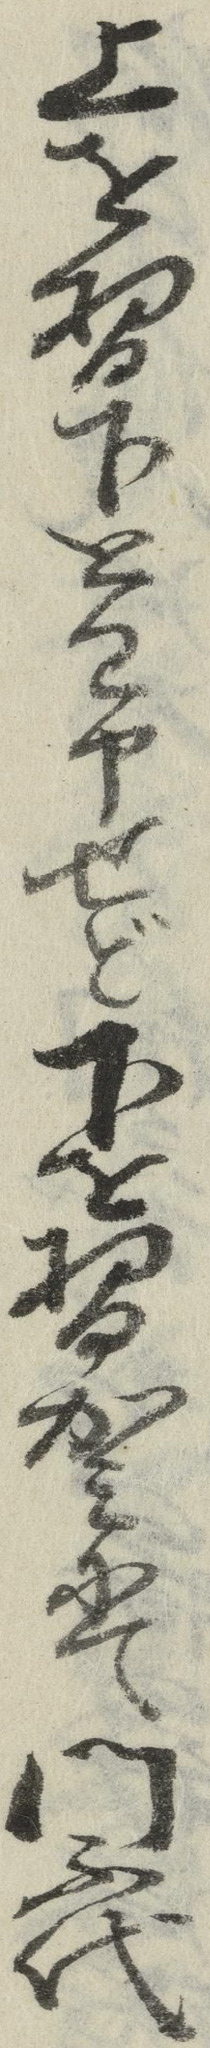上を習下とわ申せど下を習がみにて門ふ代
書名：浅間大焼騒動記　上
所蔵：東京大学地震研究所図書室 Earthquake Research Institute Library, The University of Tokyo, JAPAN
